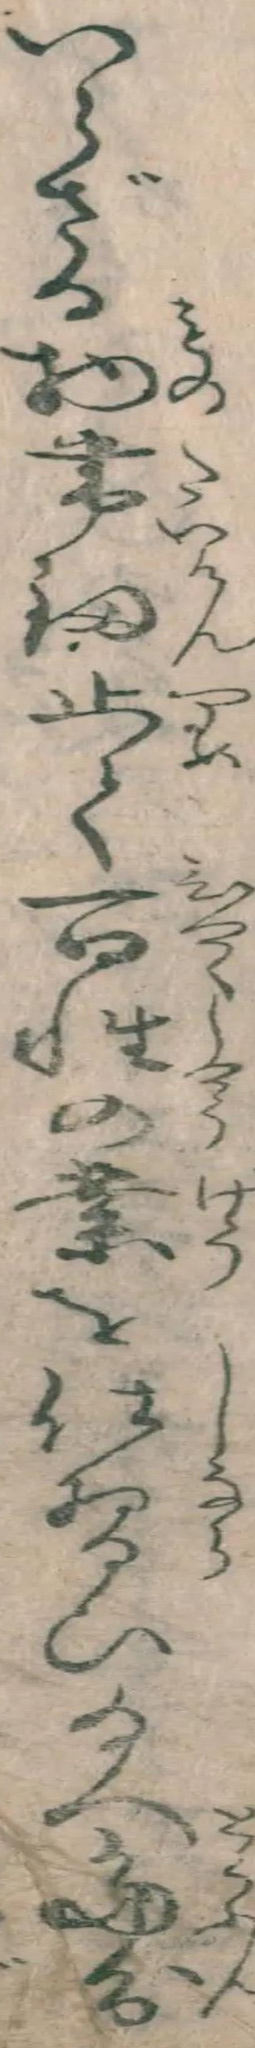いらざる物帯剣止て百姓の業を仕習ひ給へ当分
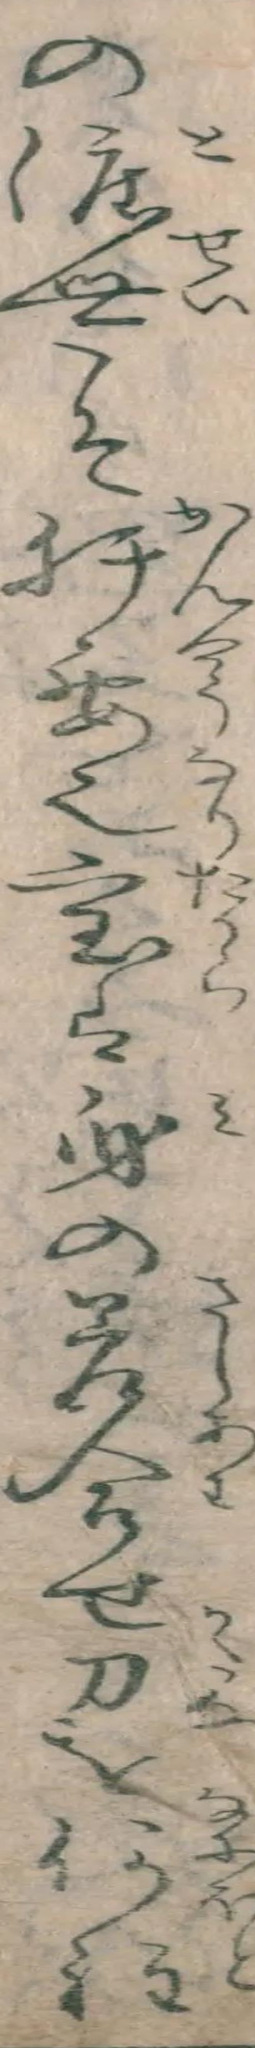の渡世こそ肝要也宝は身の差合せ刀を何程
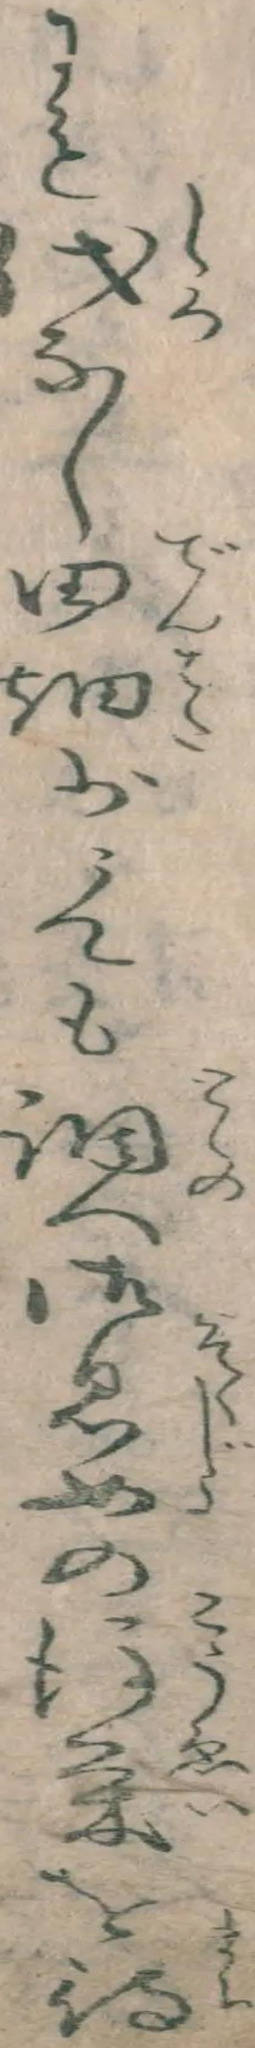にも代なし田畑少にても調へ御息女の後栄を待
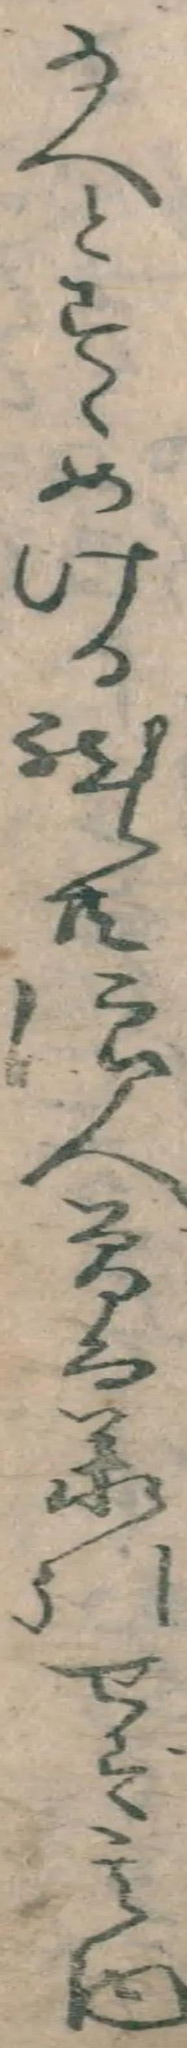給へとすゝめける然共浪人曽而承引せず其内

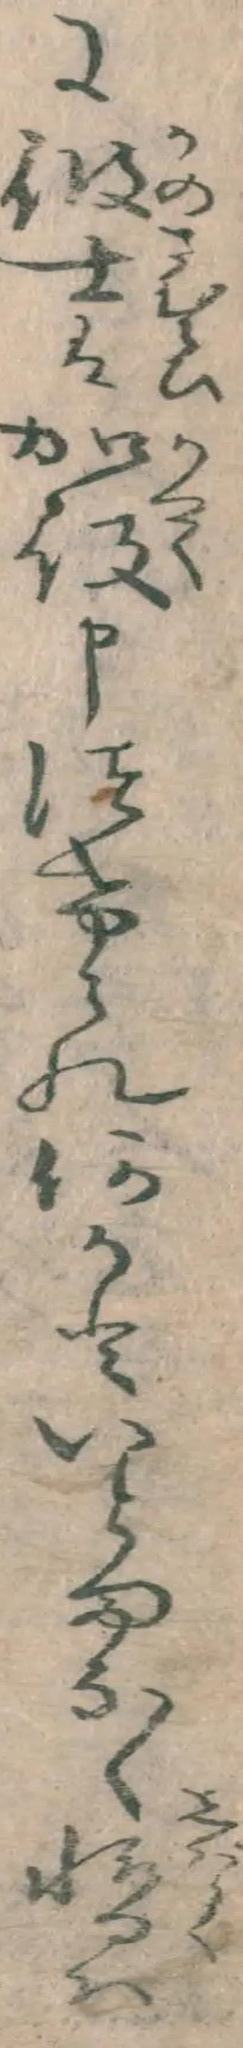に彼士は加役申つけられ何かといとまなく暫は
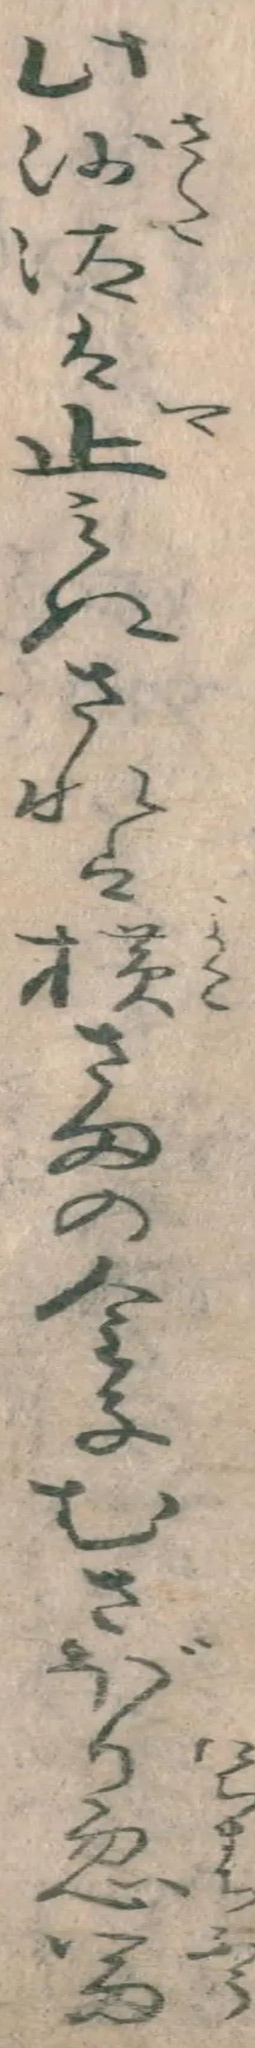此沙汰は止みぬされは横さまの金子むさぼり忽富
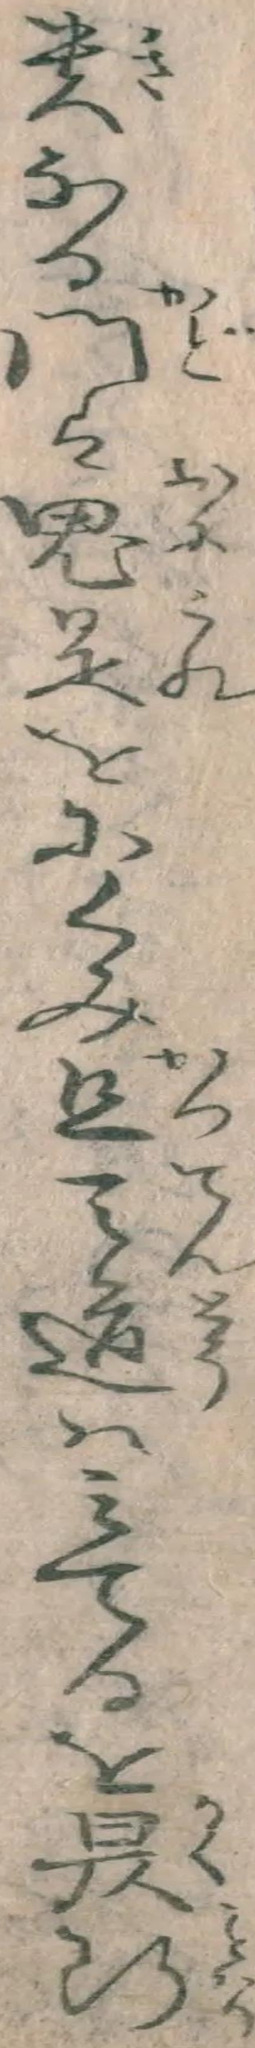貴なる門は鬼是をにくみ且天道はみてるを昃断
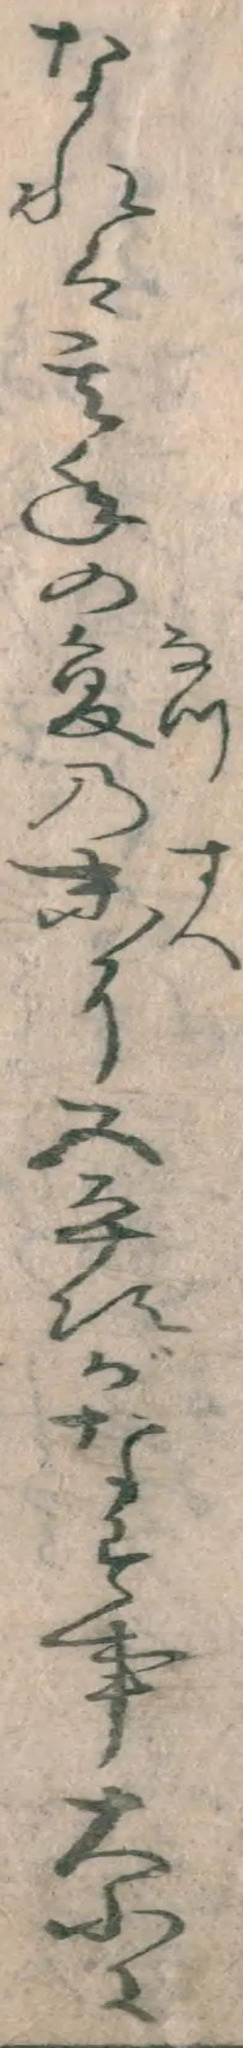なれは其年の夏の末に五平次がなす事大小に
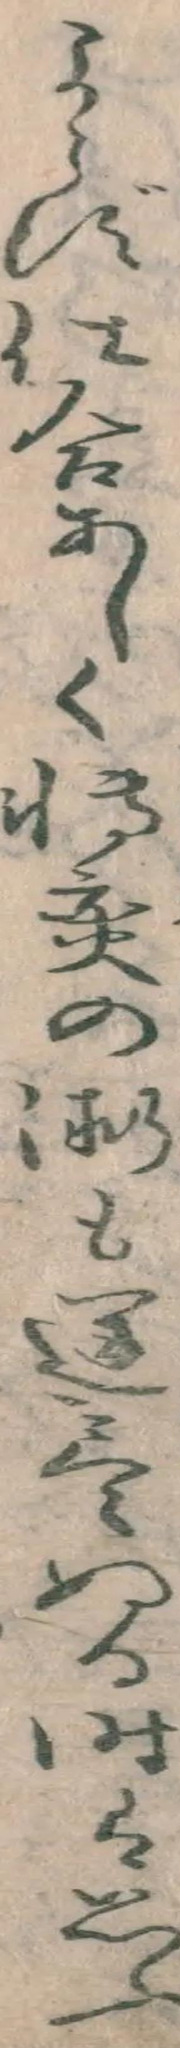よらず仕合あしく博奕の術も運尽ぬる時は思ふ
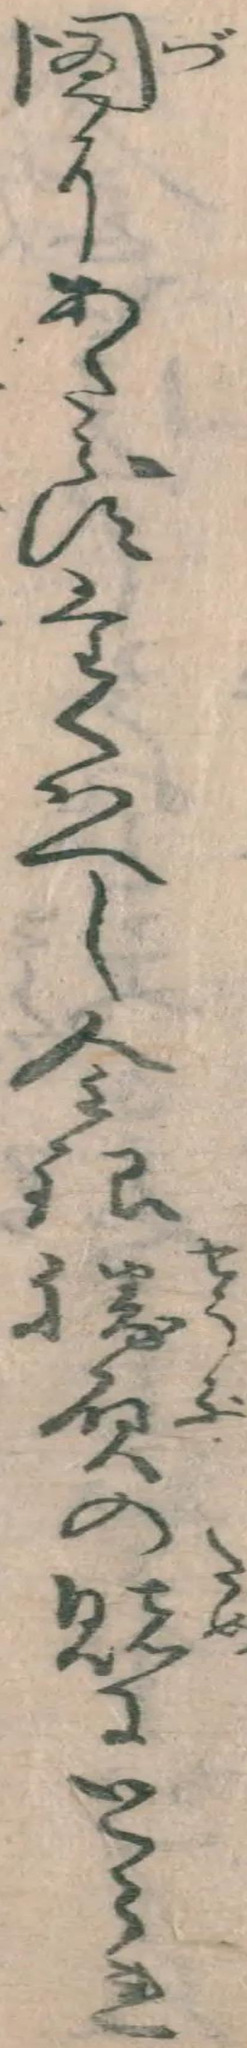図にあたらすたくはへし金銀勝負の賭にとられ
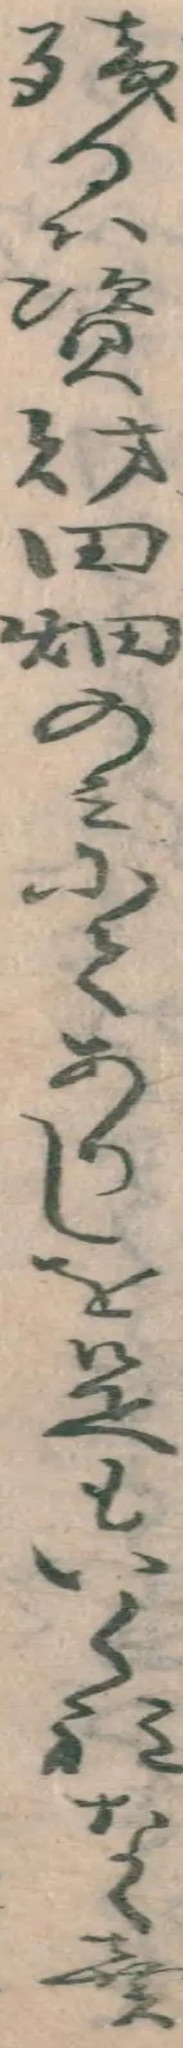残るは資財田畑のみにてありしを是もいく程なく売
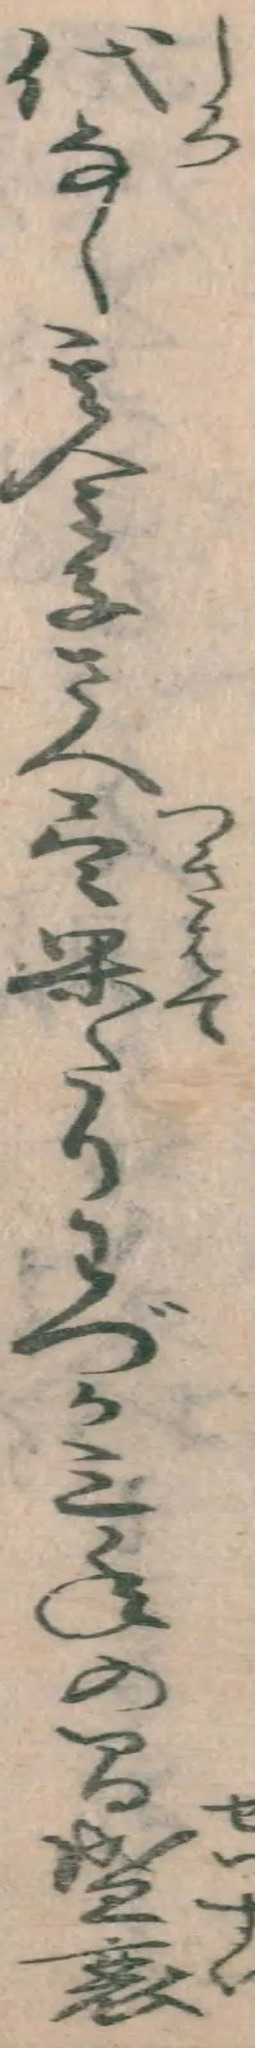代なし其金子さへ尽果たりわづか三年の間盛衰
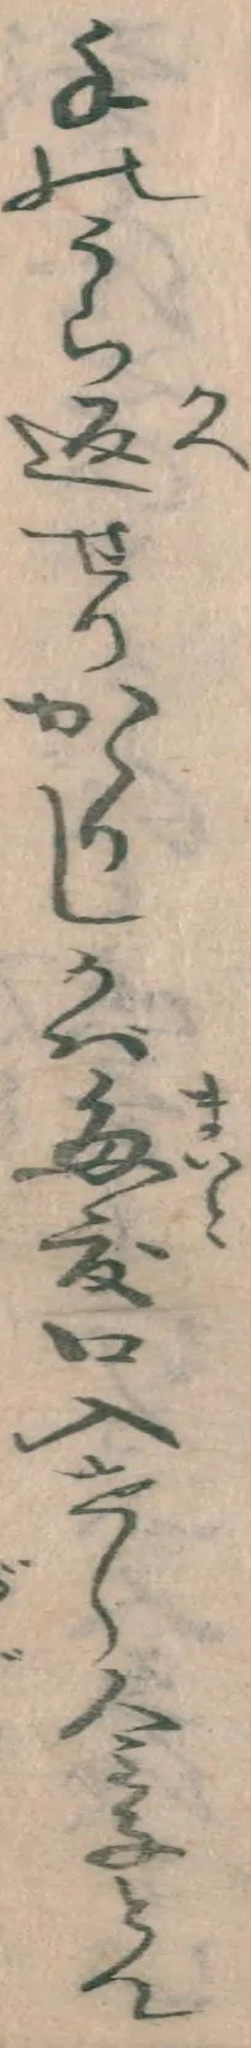手のうら返せりかゝりしかば毎度口入せし金子とて
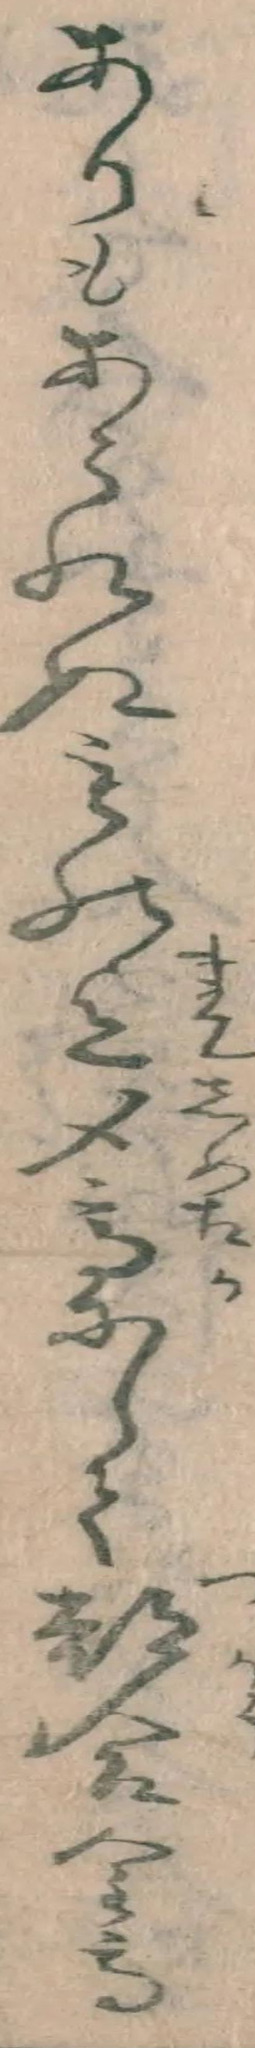ありもあられぬもの迄〆高にして都合金高
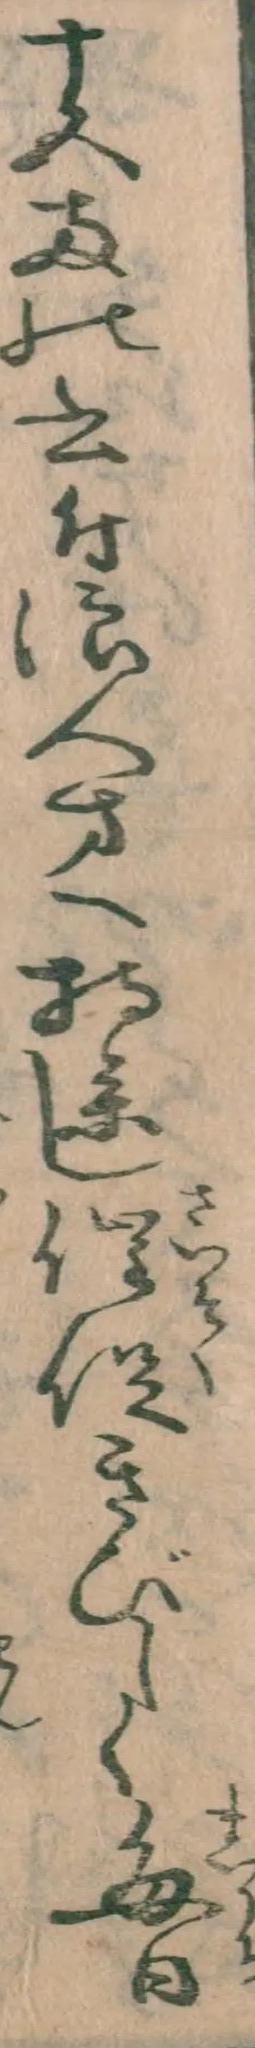十五両の書付浪人方へ持参し催促きびしく毎日
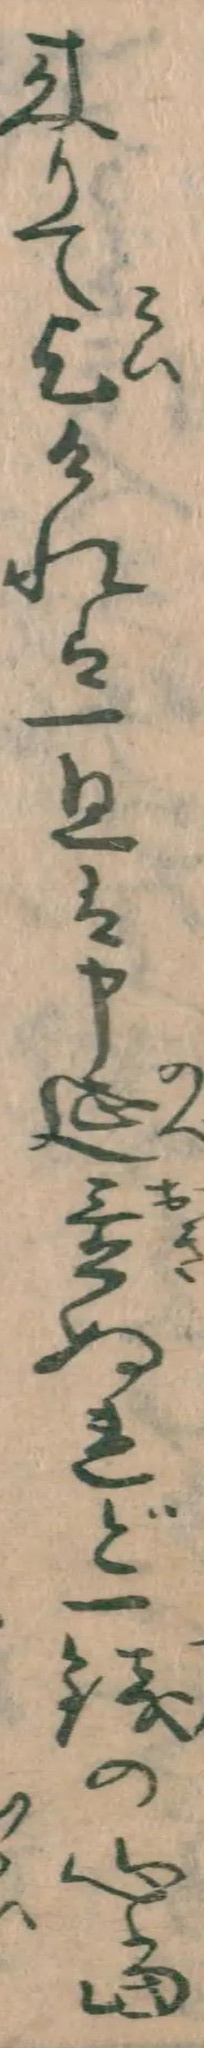来りて乞けれは一旦は申延置ぬれど一銭の心当
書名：怪談御伽童 5巻. [2]
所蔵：国立国会図書館 National Diet Library, JAPAN
